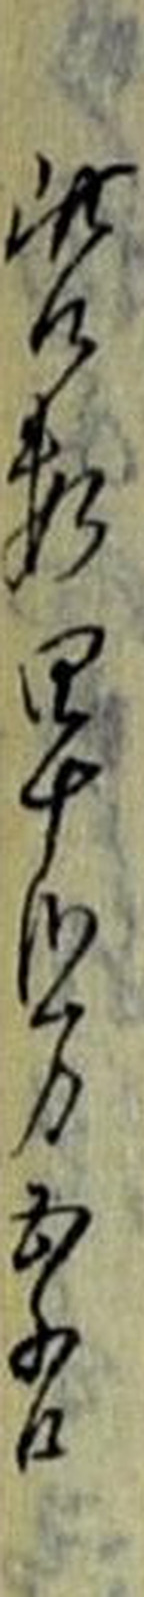此口数四十弐万五千口同断
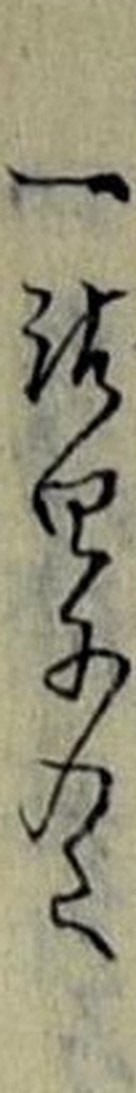一銀四千貫匁
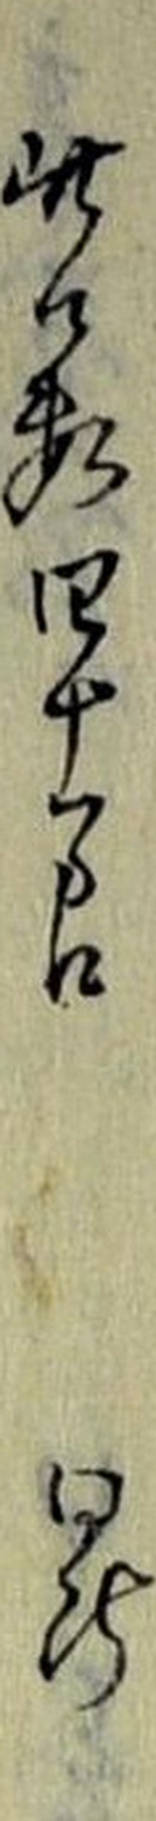此口数四十万口同断
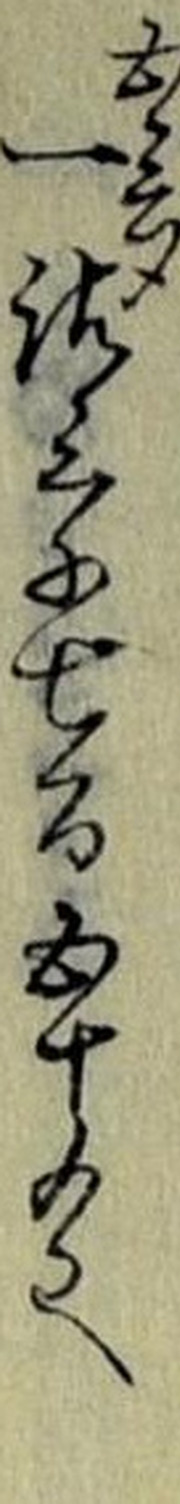一銀三千七百五十貫匁
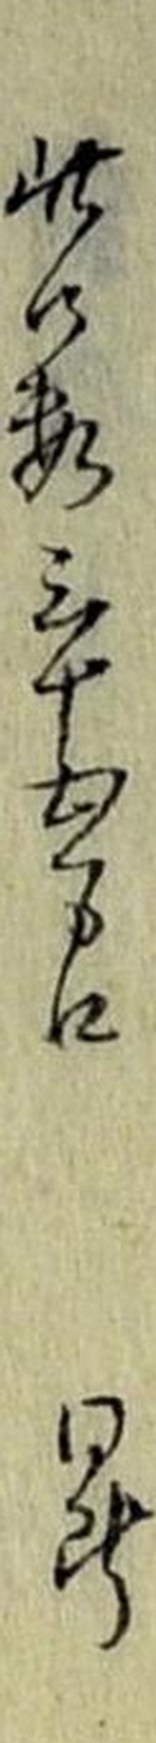此口数三十五万口同断
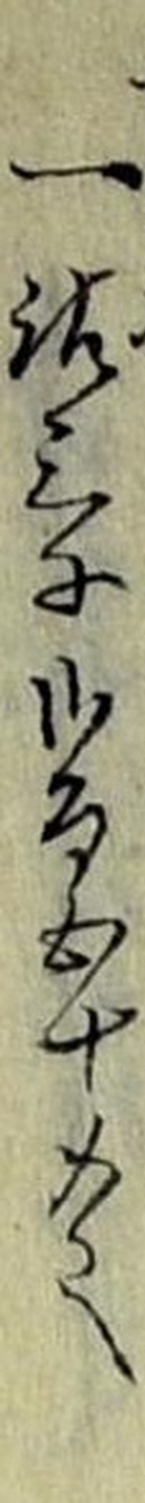一銀三千弐百五十貫匁
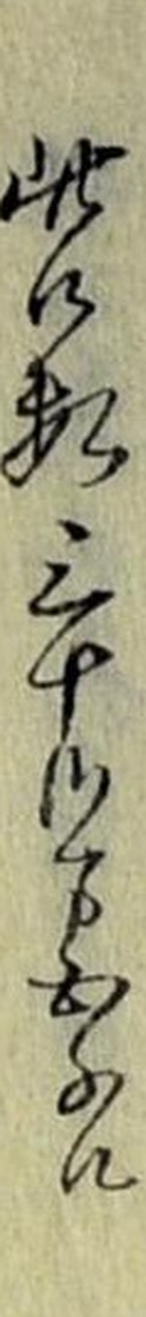此口数三十弐万五千口同断
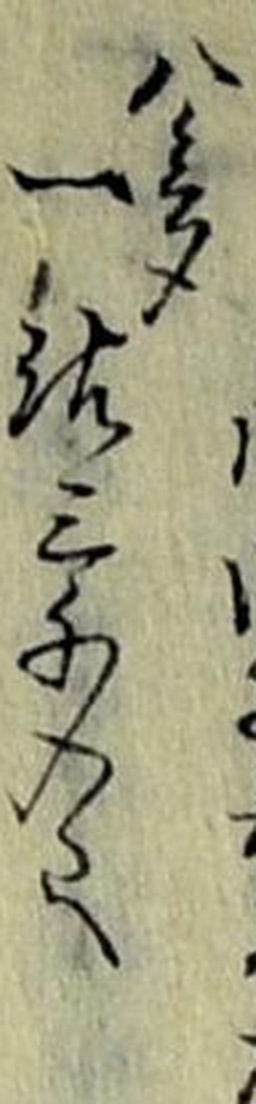一銀三千貫匁
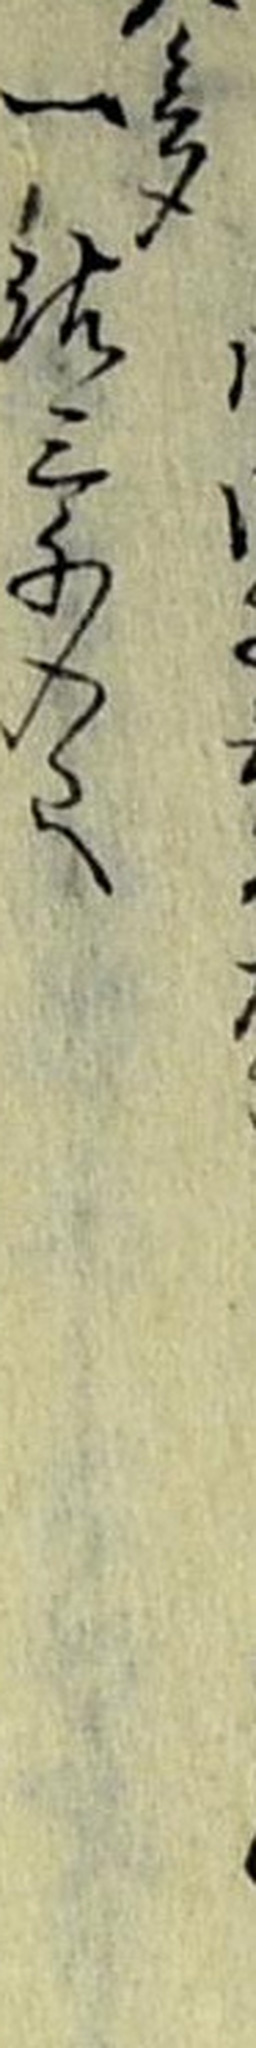一銀三千貫匁
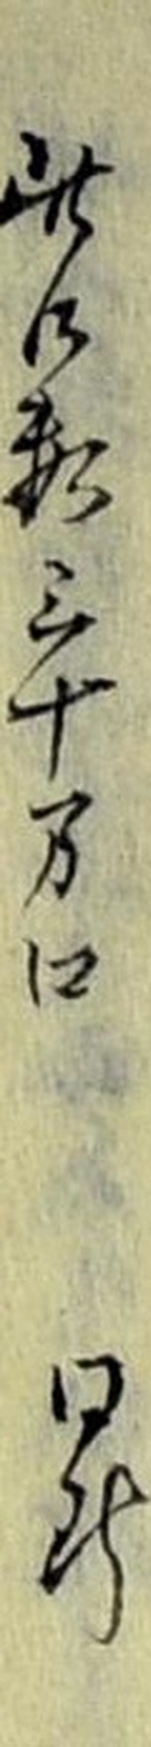此口数三十万口同断

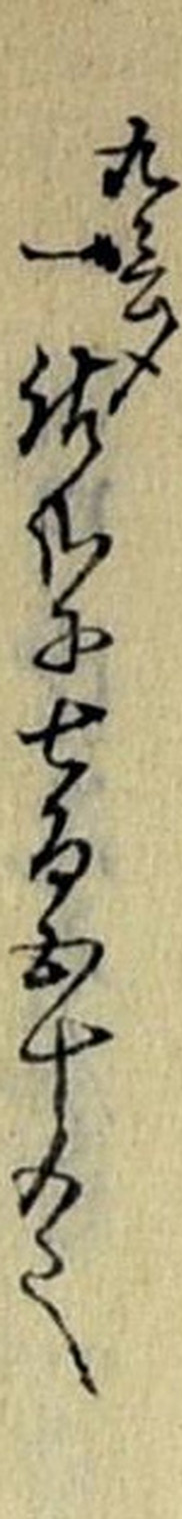一銀弐千七百五十貫匁
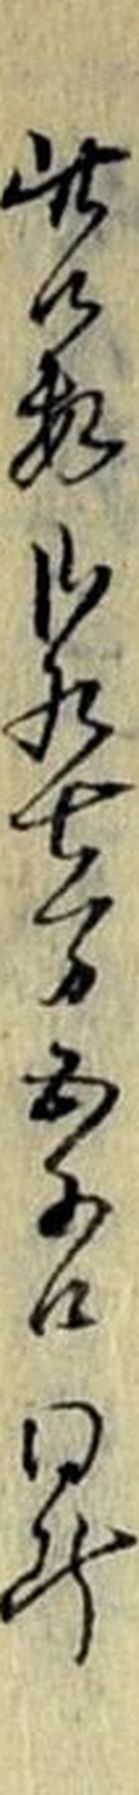此口数弐拾七万五千口同断
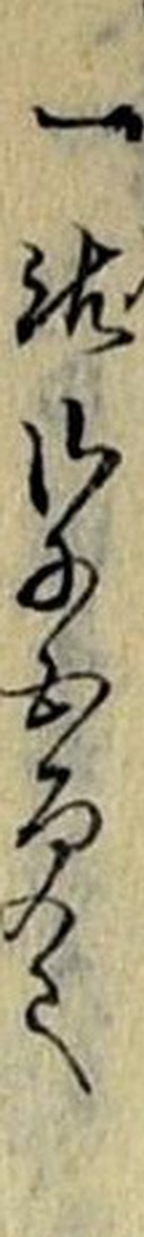一銀弐千五百貫匁
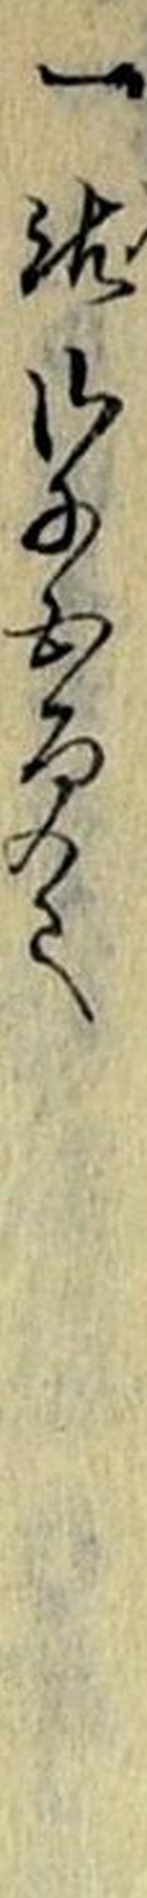一銀弐千五百貫匁
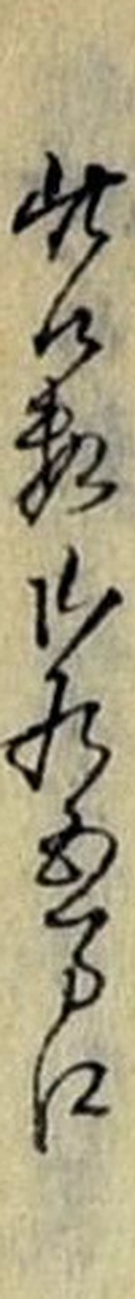此口数弐拾五万口
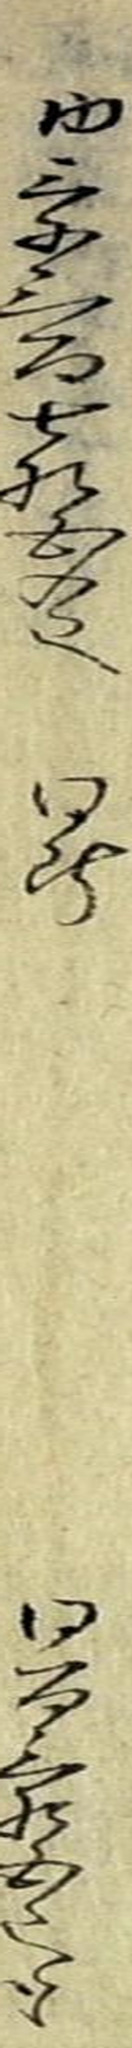内三千三百七拾五貫匁同断同百三拾五匁つヽ
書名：命令之部 六
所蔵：福井県文書館 Fukui Prefectural Archives
